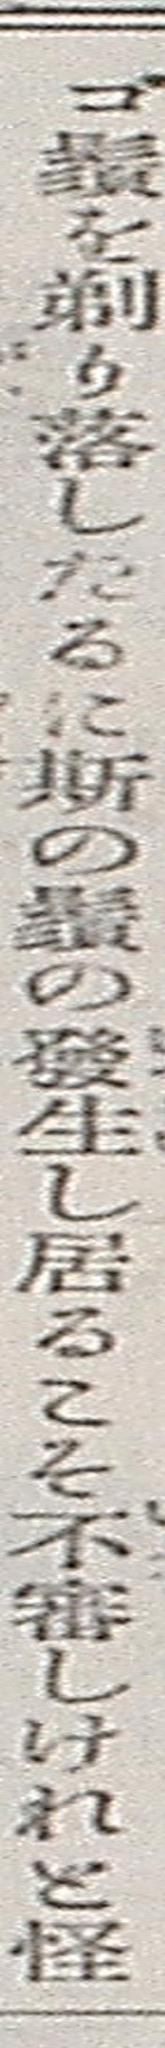ゴ鬚を剃り落したるに斯の鬚の発生し居るこそ不審しけれど怪
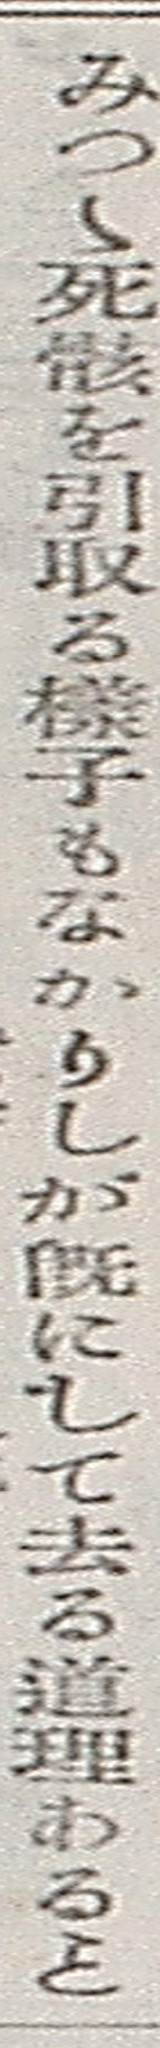みつゝ死骸を引取る様子もなかりしが既にして去る道理あること
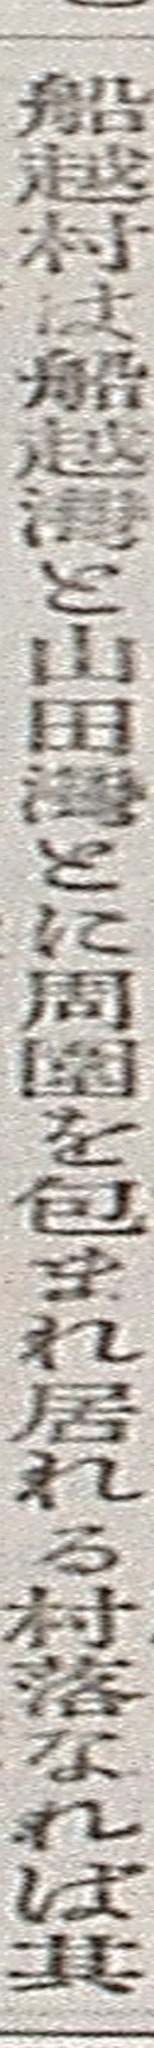船越村は船越湾と山田湾とに周囲を包まれ居れる村落なれば其
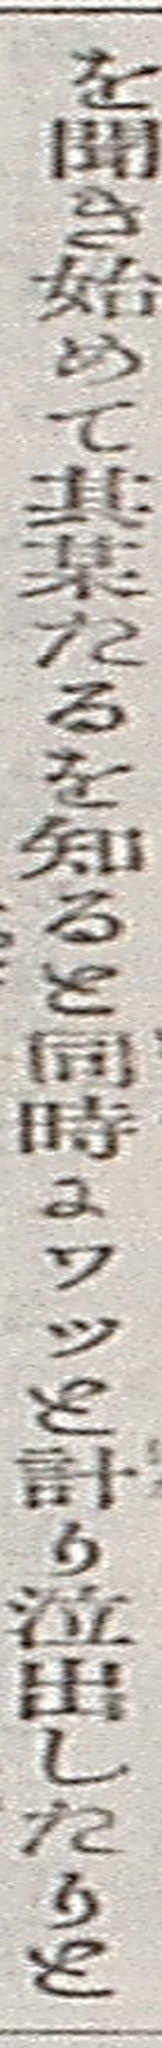を聞き始めて其某たるを知ると同時にワツと計り泣出したりと
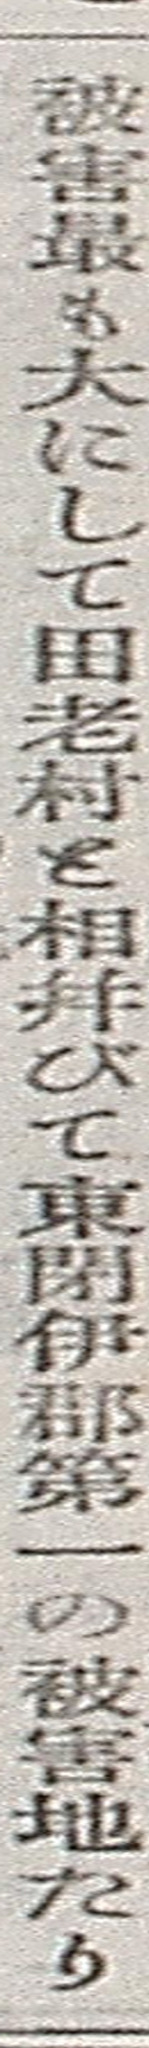被害最も大にして田老村と相并びて東閉伊郡第一の被害地たり
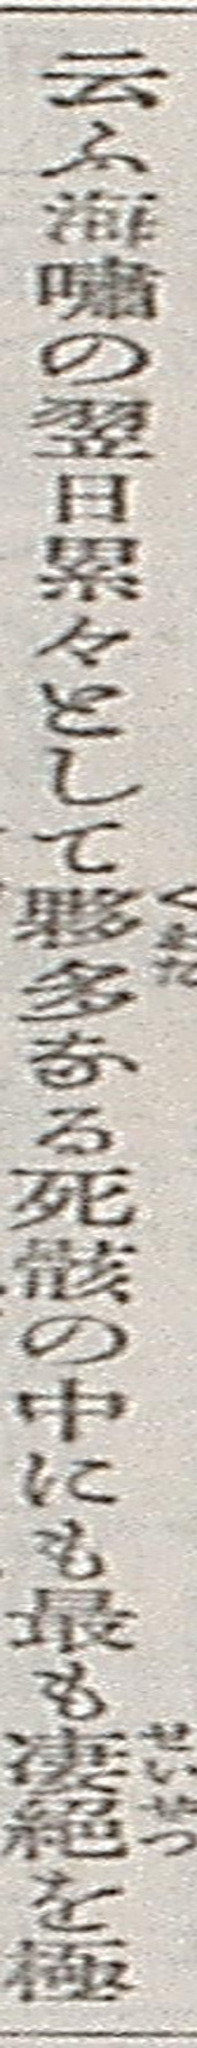云ふ海嘯の翌日累々として夥多なる死骸の中にも最も凄絶を極
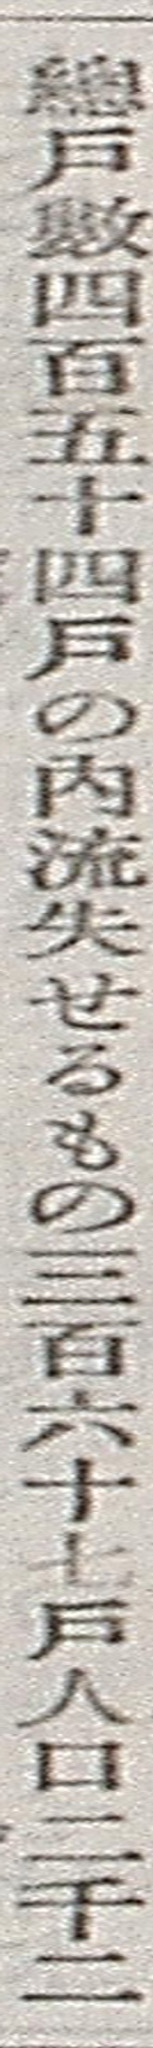総戸数四百五十四戸の内流失せるもの三百六十七戸人口二千二
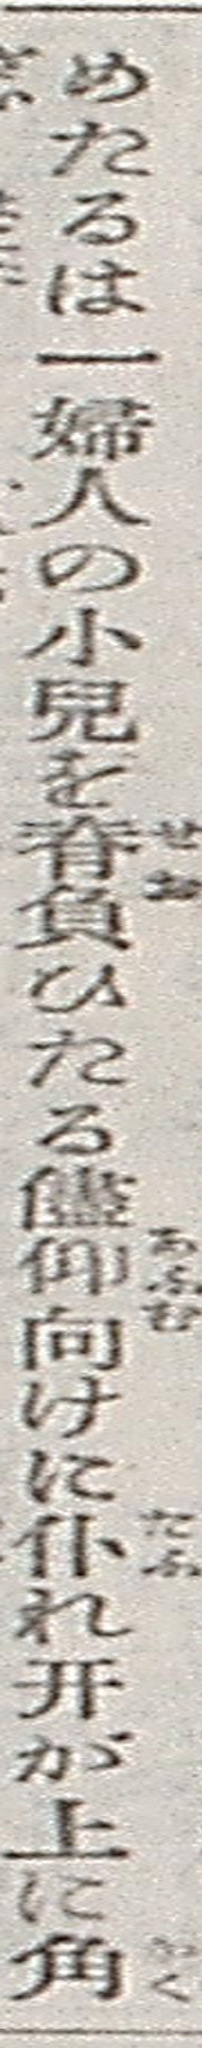めたるは一婦人の小兒を背負ひたる侭仰向けに仆れ幵が上に角
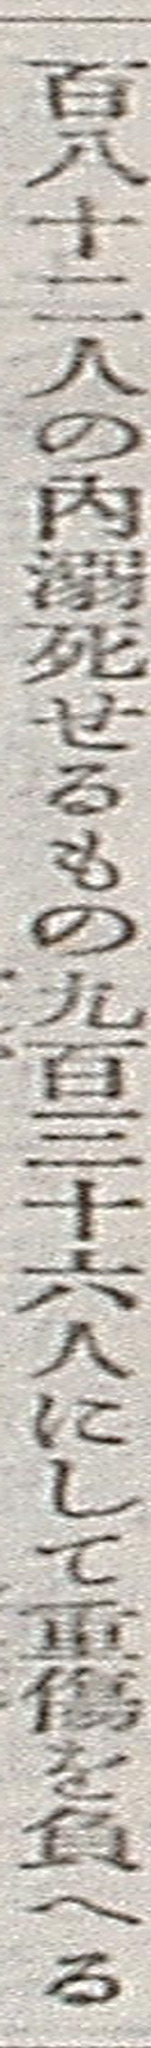百八十二人の内溺死せるもの九百三十六人にして重傷を負へる
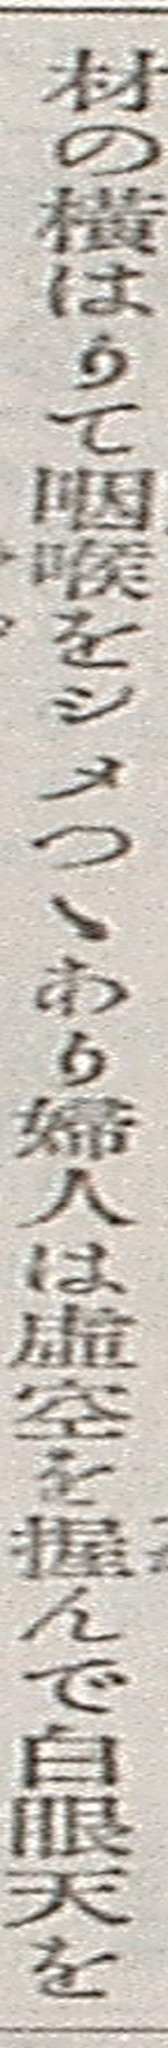材の横はりて咽喉をシメつゝあり婦人は虚空を握んで白眼天を
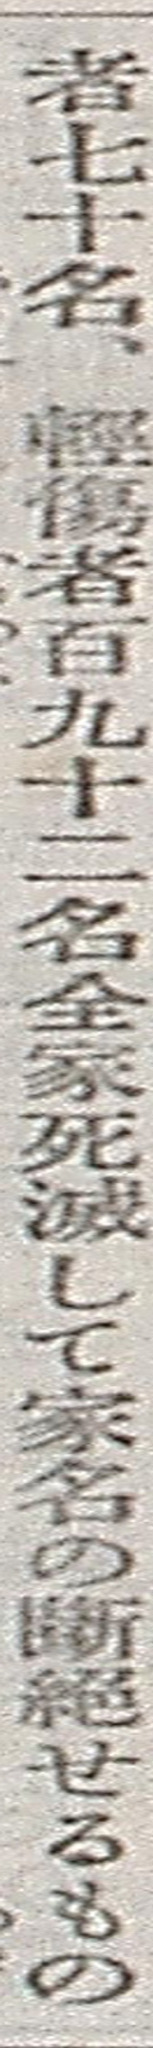者七十名、軽傷者百九十二名全家死滅して家名の断絶せるもの
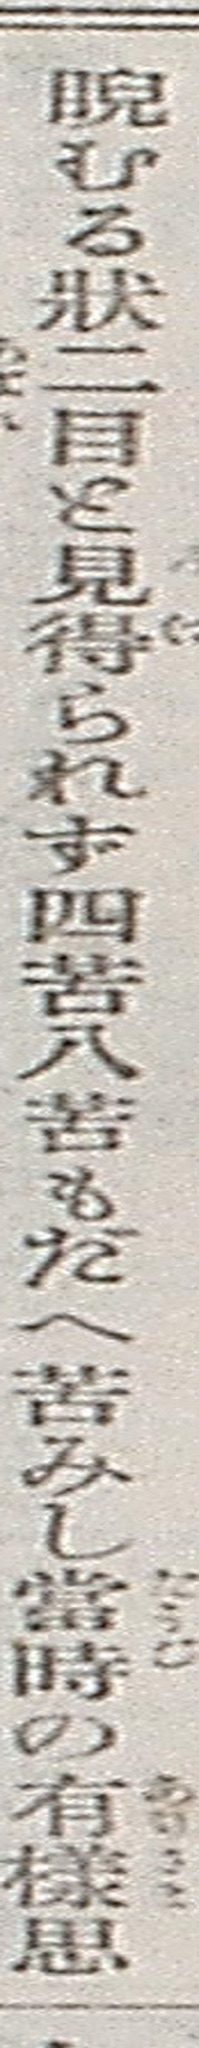睨むる状二目と見得られず四苦八苦もだへ苦みし当時の有様思
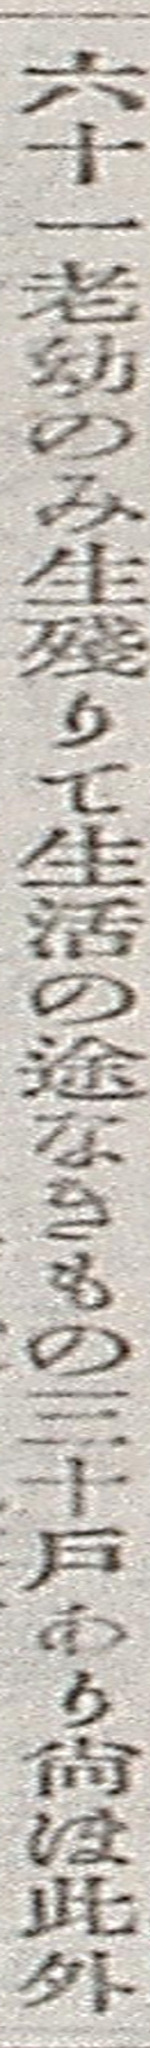六十一老幼のみ生残りて生活の途なきもの三十戸あり尚ほ此外
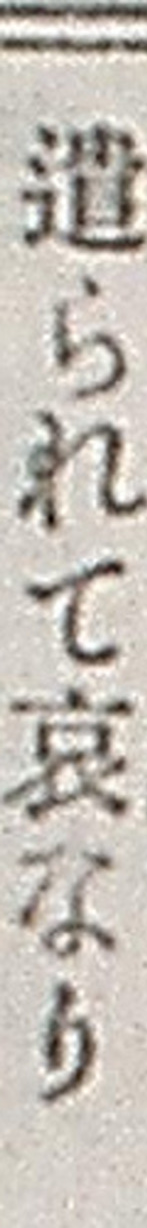遣られて哀なり
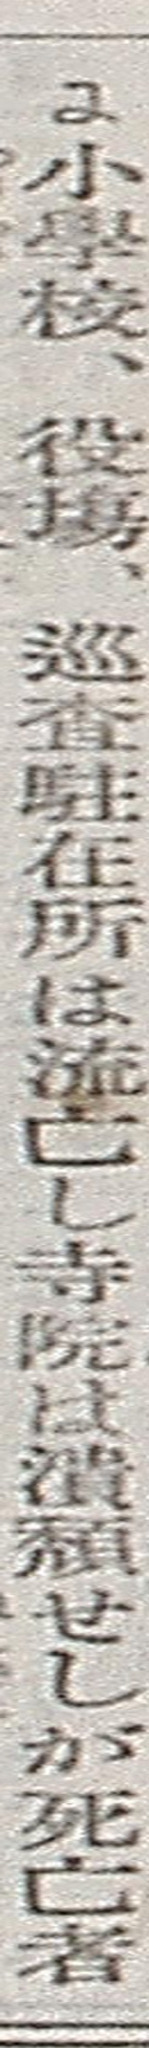に小学校、役場、巡査駐在所は流亡し寺院は潰頽せしが死亡者
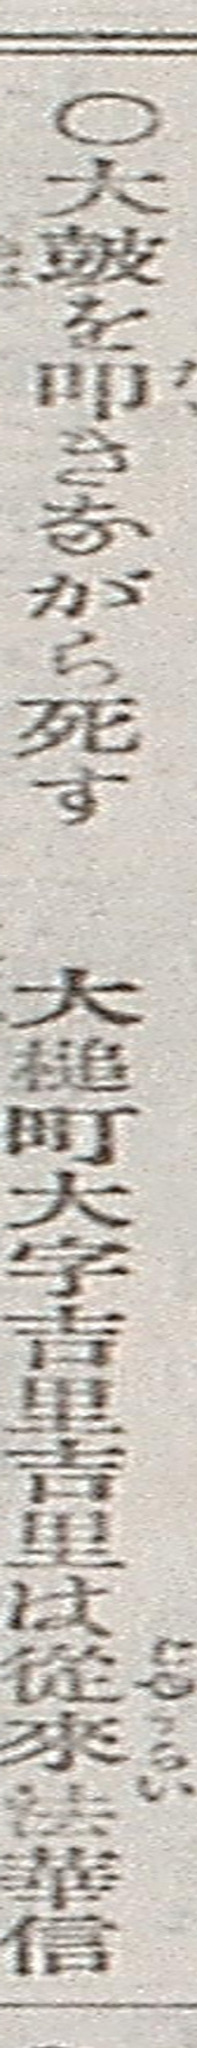○大皷を叩きながら死す大槌町大字吉里吉里は従来法華信
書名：風俗畫報臨時増刊第百二十號　大海嘯被害録（下）
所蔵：東京大学地震研究所図書室 Earthquake Research Institute Library, The University of Tokyo, JAPAN
